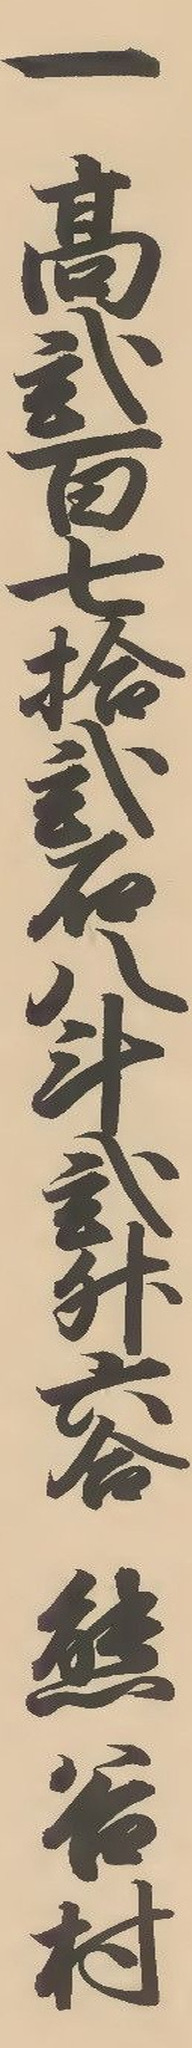一高弐百七拾弐石八斗弐升六合熊谷村
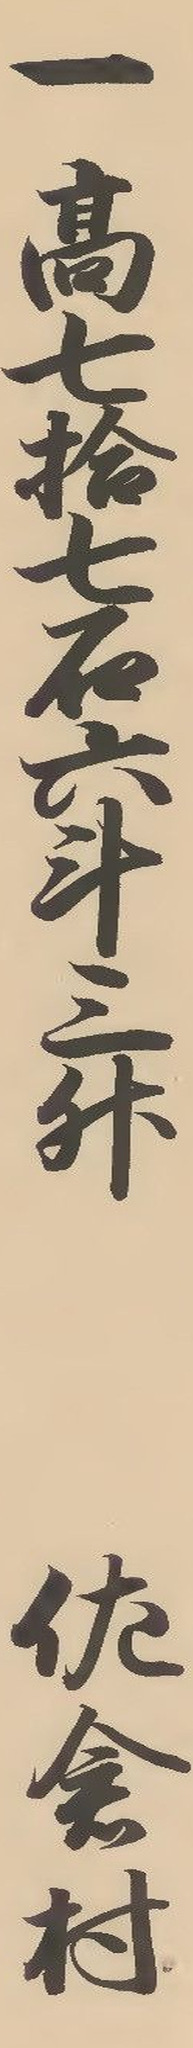一高七拾七石六斗三升佐倉村
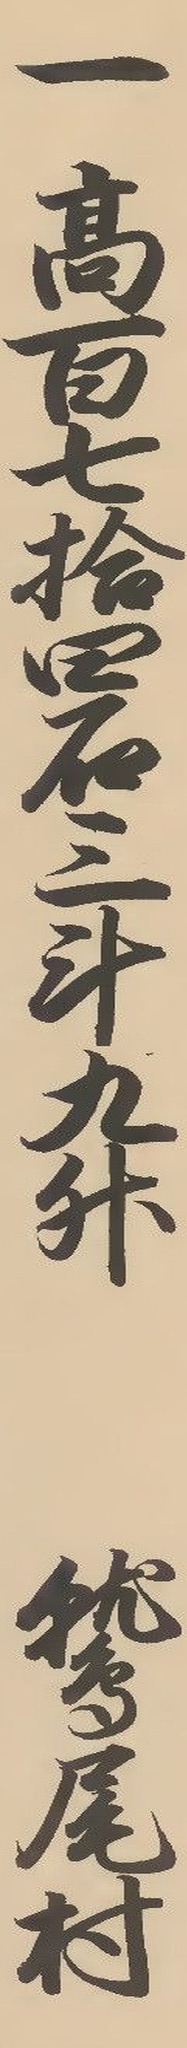一高百七拾四石三斗九升鷲尾村
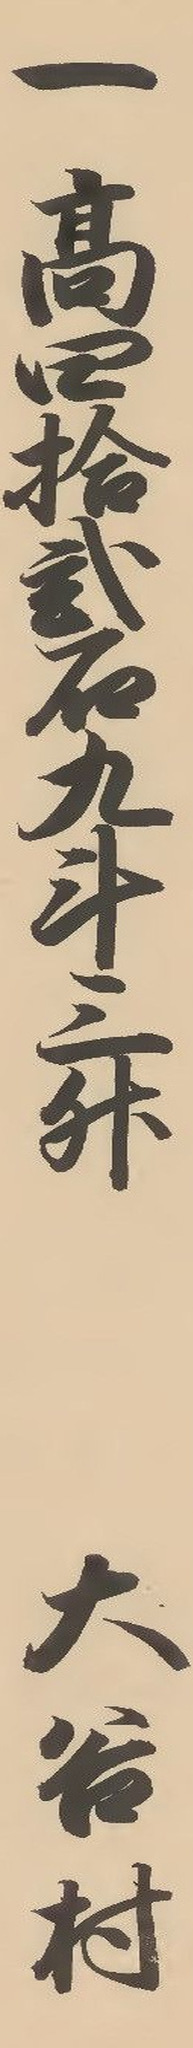一高四拾弐石九斗三升大谷村
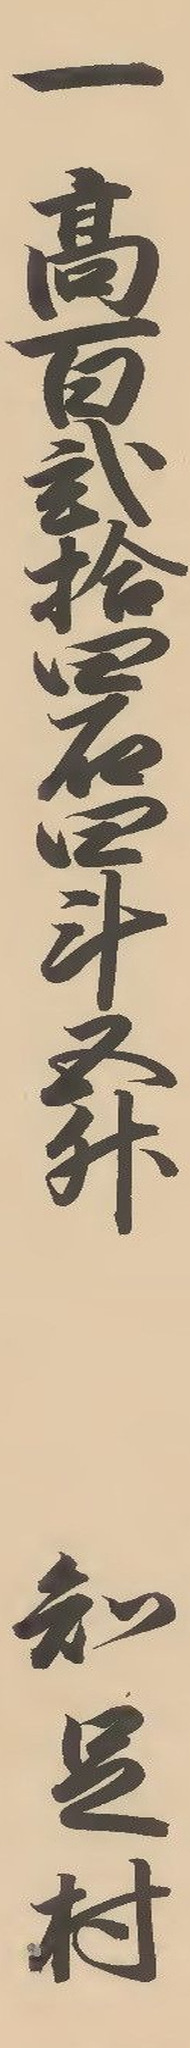一高百弐拾四石四斗五升知足村
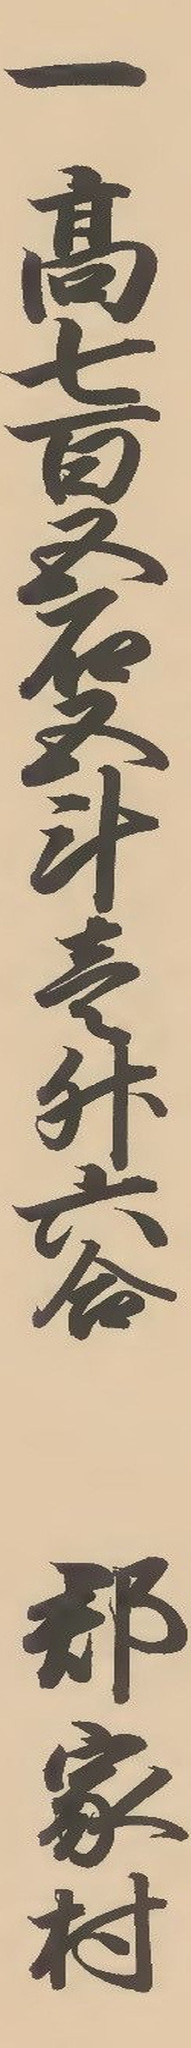一高七百五石五斗壱升六合郡家村
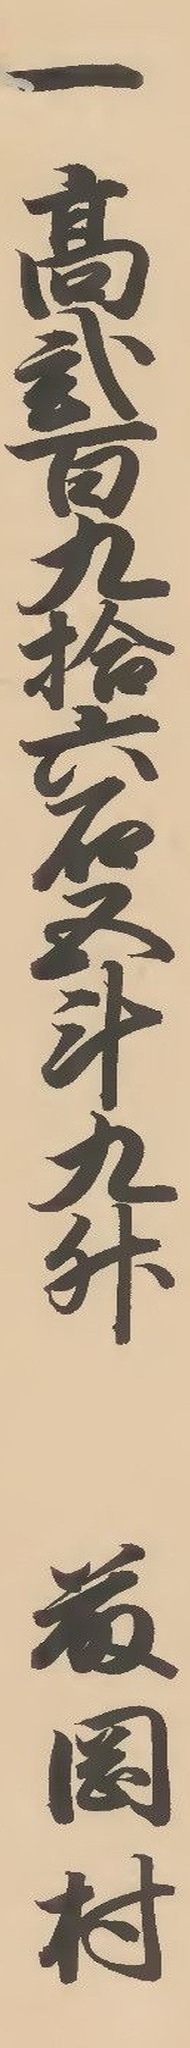一高弐百九拾六石五斗九升藤岡村

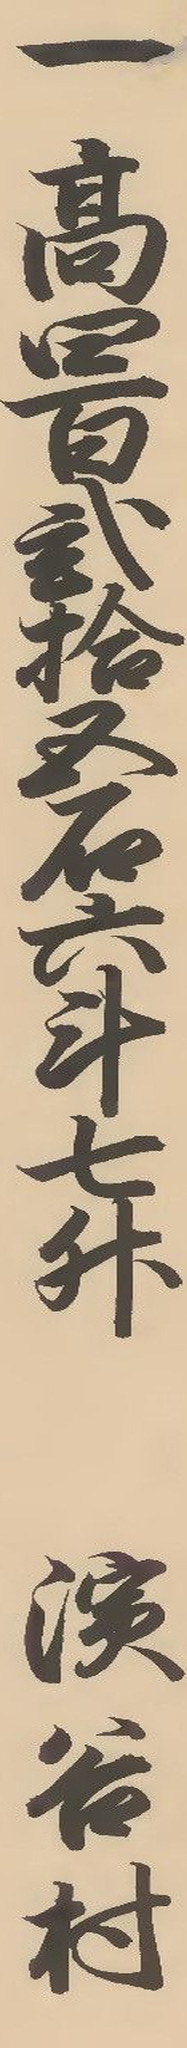一高四百弐拾五石六斗七升浜谷村
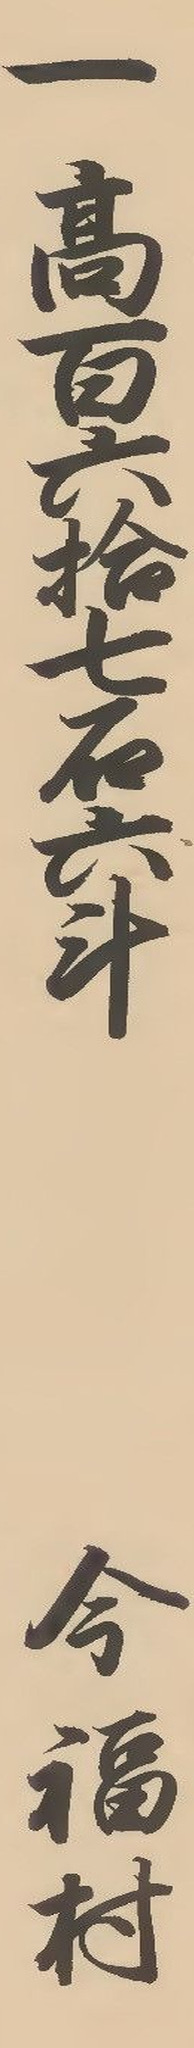一高百六拾七石六斗今福村
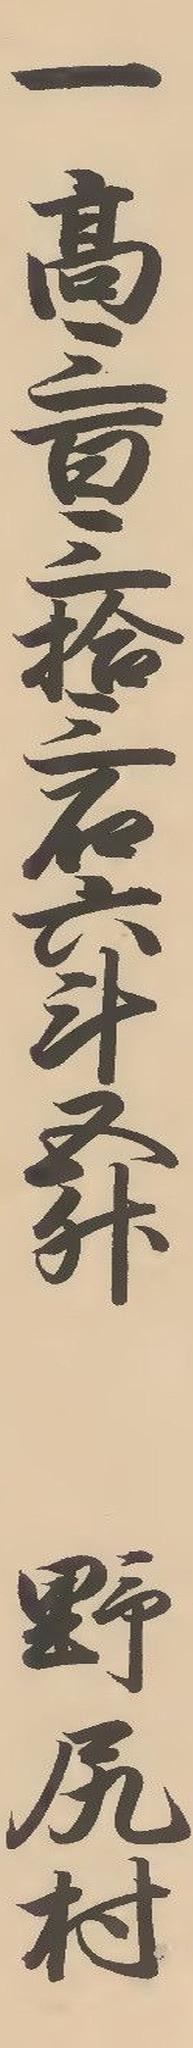一高三百三拾三石六斗五升野尻村
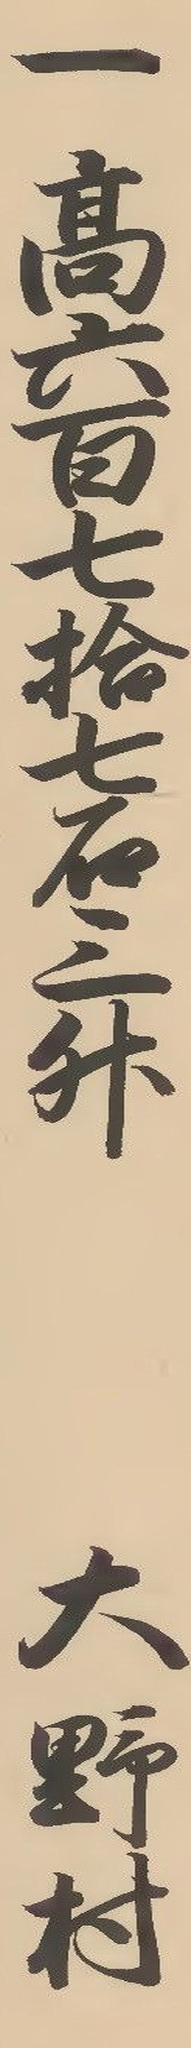一高六百七拾七石三升大野村
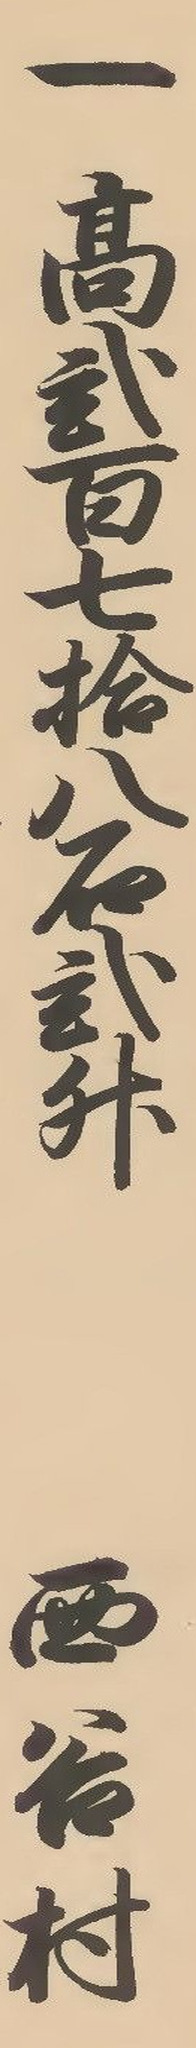一高弐百七拾八石弐升西谷村
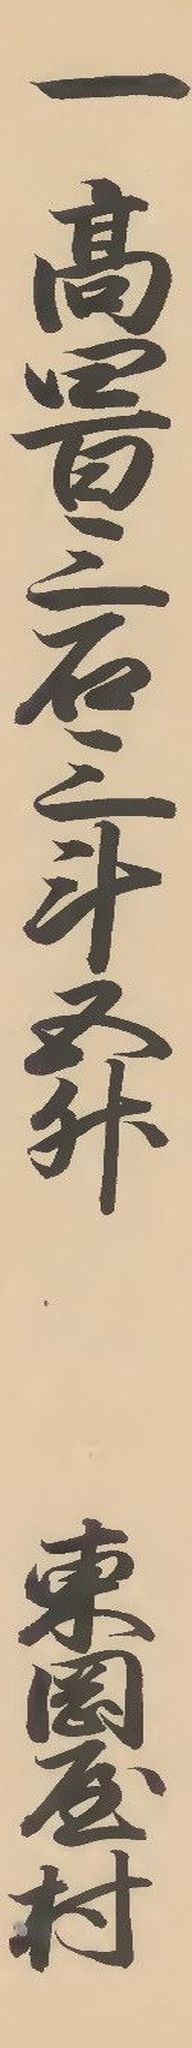一高四百三石三斗五升東岡屋村
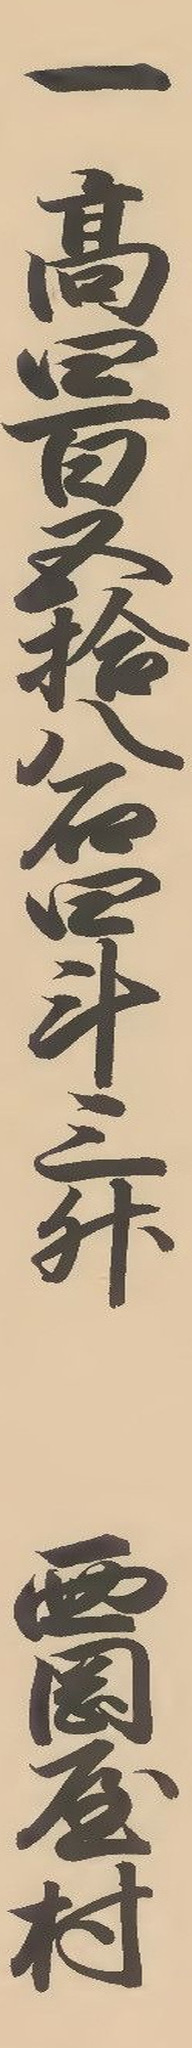一高四百五拾八石四斗三升西岡屋村
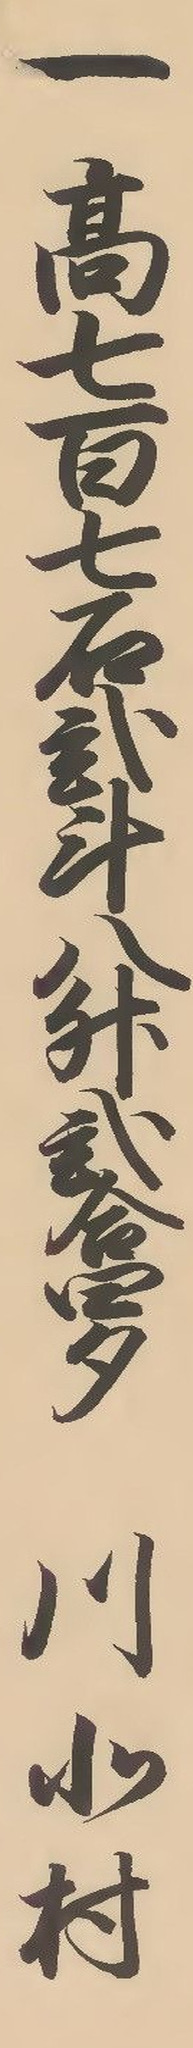一高七百七石弐斗八升弐合四勺川北村

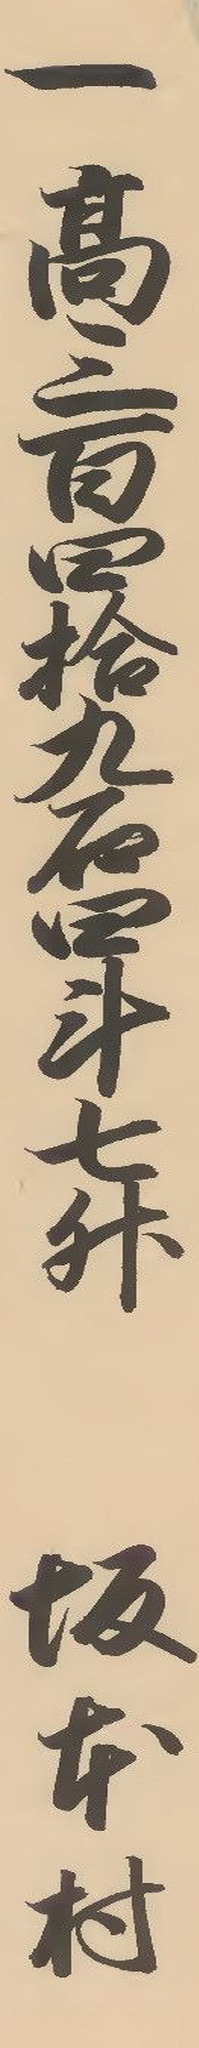一高三百四拾九石四斗七升坂本村
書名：丹波国郷帳
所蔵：国立公文書館 National Archives of Japan
